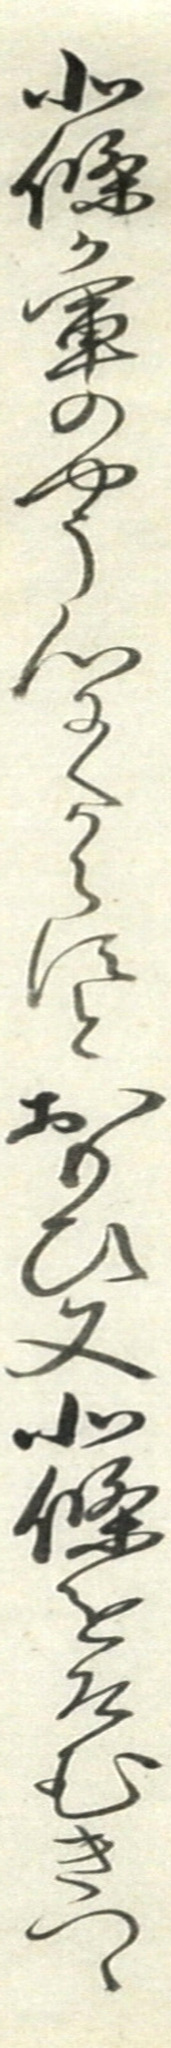北条か軍のやう心にくからすとおもひ又北条をそむきつゝ
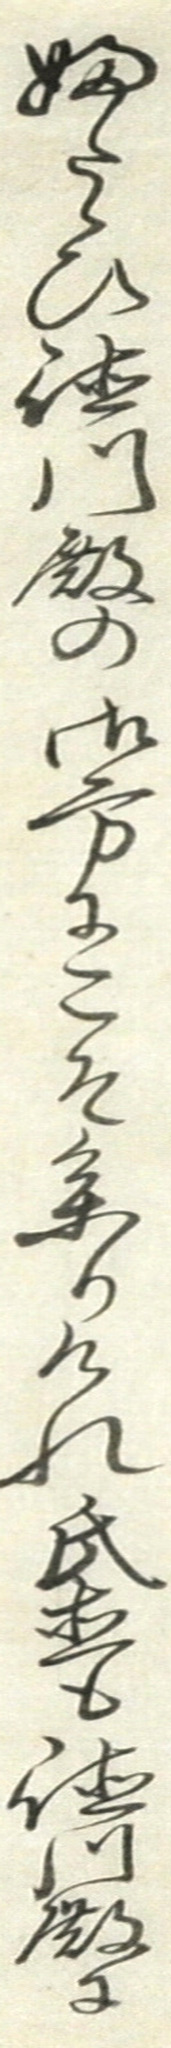ふたゝひ徳川殿の御方にこそ参りけれ氏直も徳川殿に
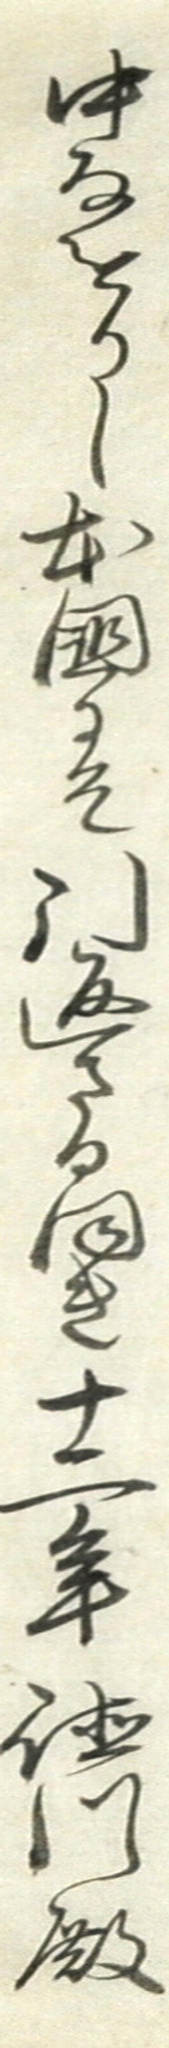中なをりし本国にそ引返さる同き十二年徳川殿
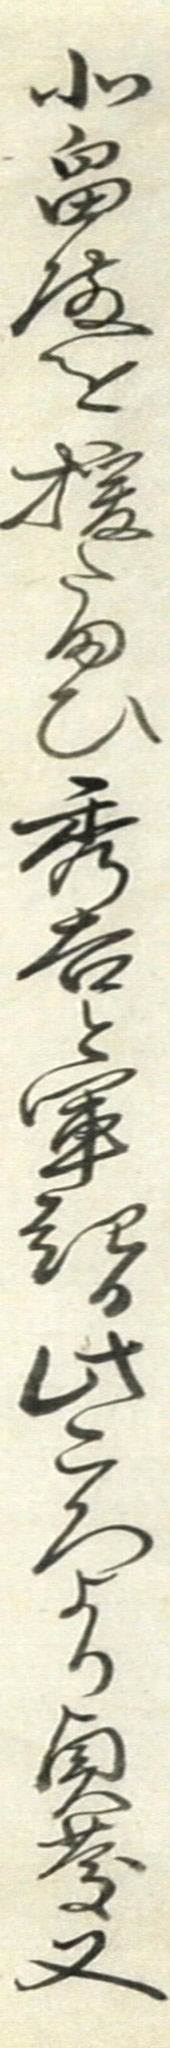北畠殿を援たまひ秀吉と軍起る此ころより貞慶又
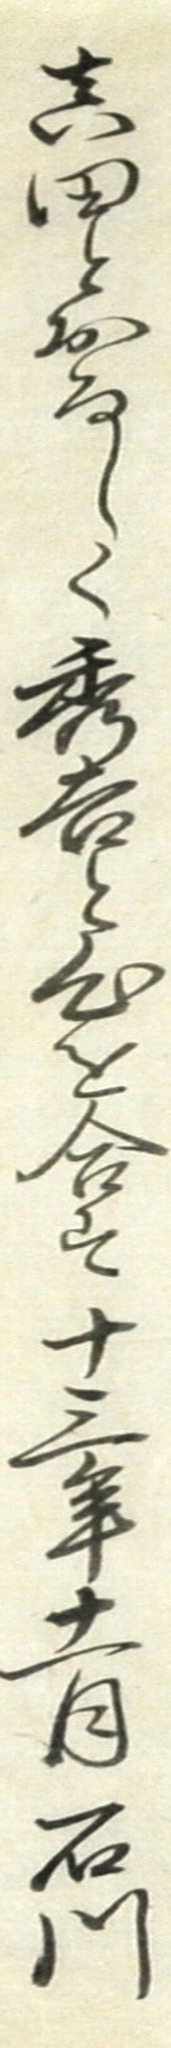真田とおなしく秀吉と心を合す十三年十一月石川
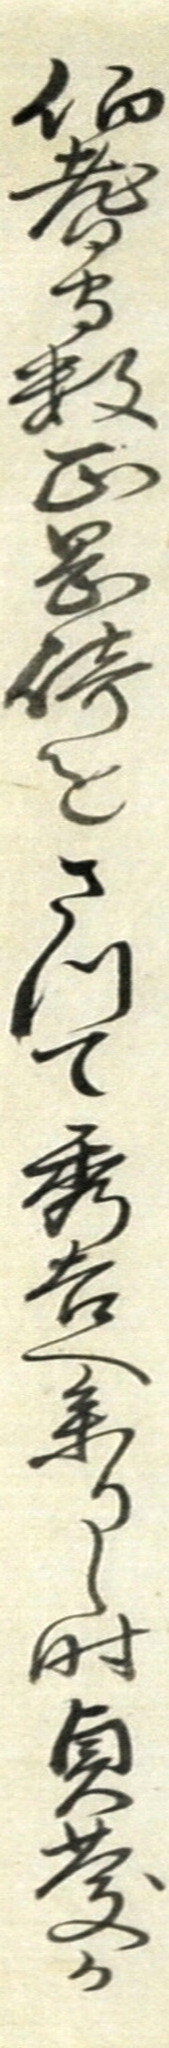伯耆守数正岡崎をさつて秀吉へ参りし時貞慶か
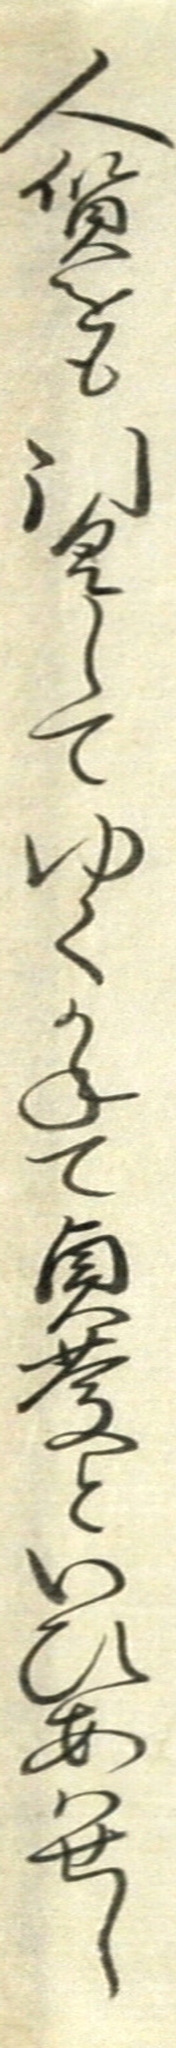人質をも引具してゆくかねて貞慶といひあはせし

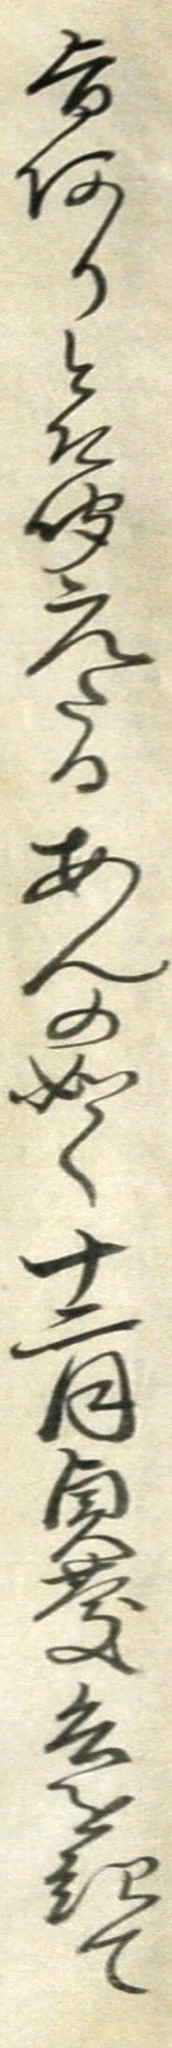旨ありとそ聞えたるあんの如く十二月貞慶兵を起て
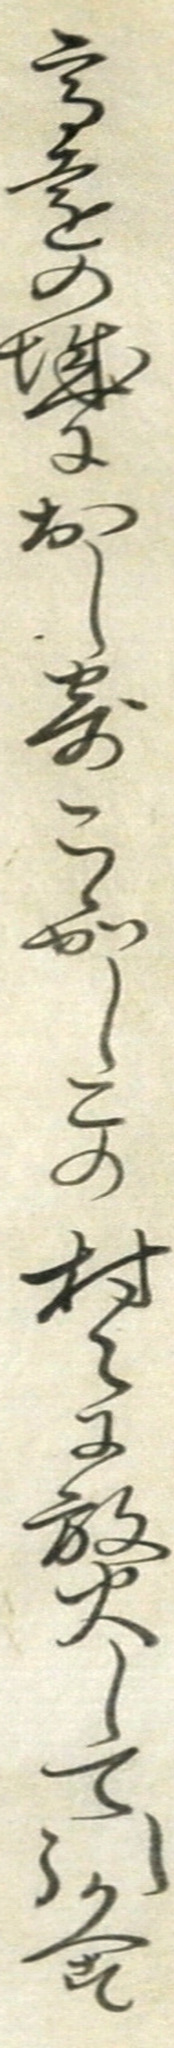高遠の城におし寄こゝかしこの村々に放火して引かへす
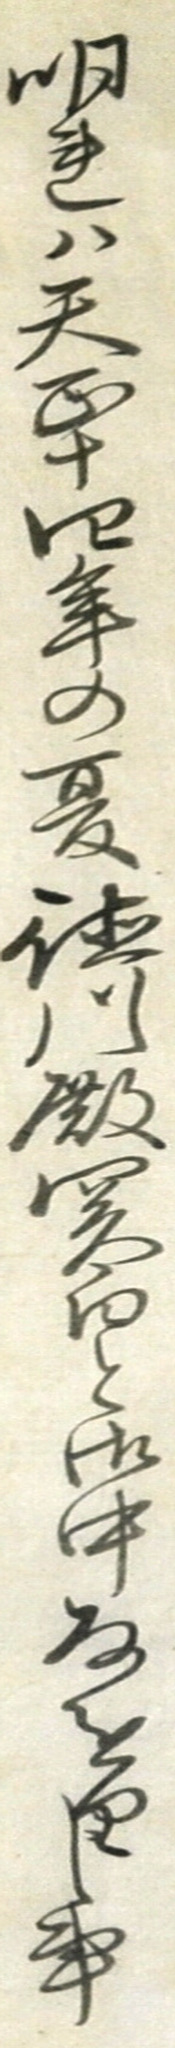明れは天正十四年の夏徳川殿関白と御中なをりし事
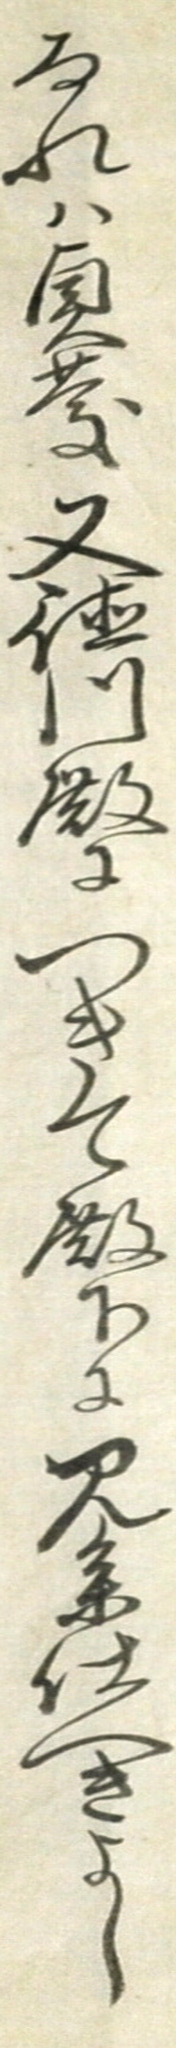なれは貞慶又徳川殿につきて殿下に見参仕へきよし
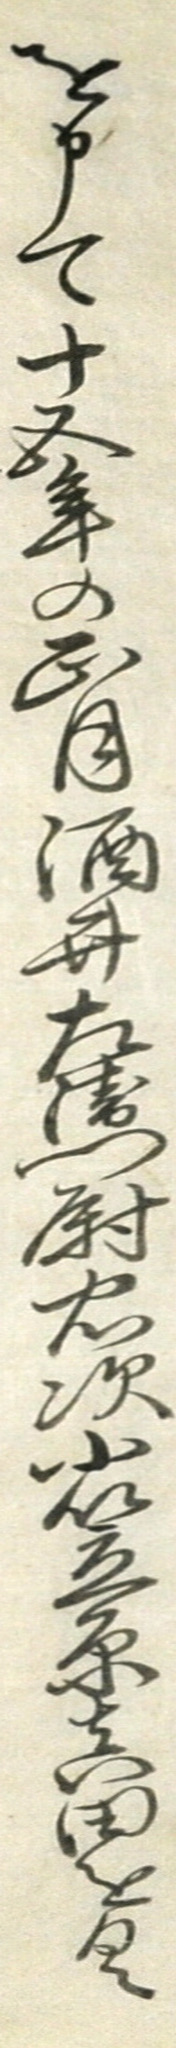を申て十五年の正月酒井左衛門尉忠次小笠原真田を具
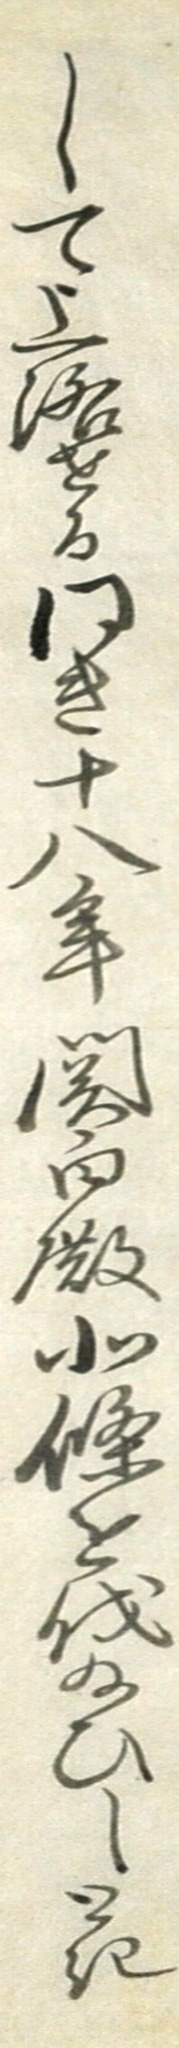して上洛せる同き十八年関白殿北条を伐給ひしとき
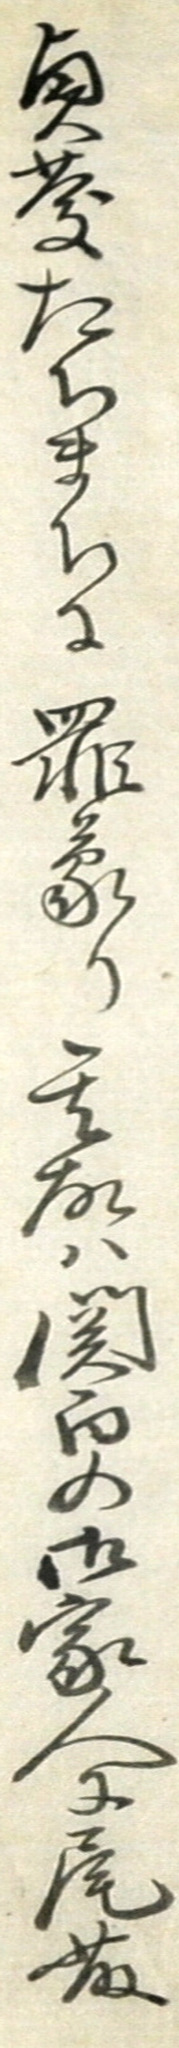貞慶たちまちに罪蒙り其故は関白の御家人に尾藤
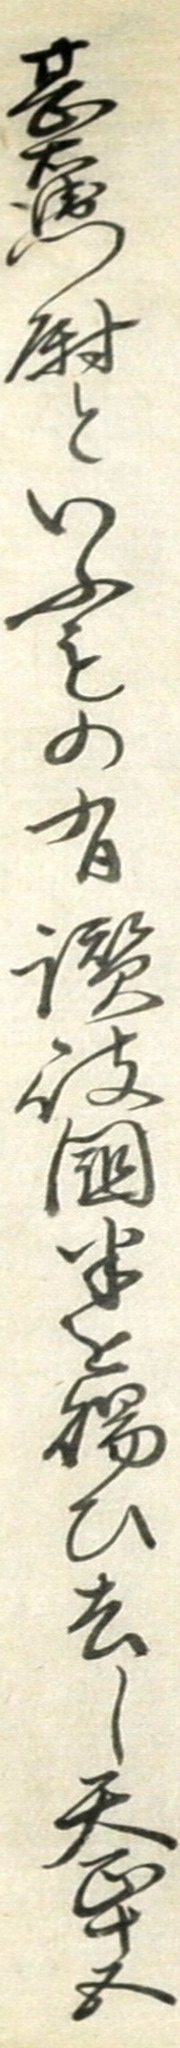甚右衛門尉といふもの有讃岐国半を賜ひ去し天正十五
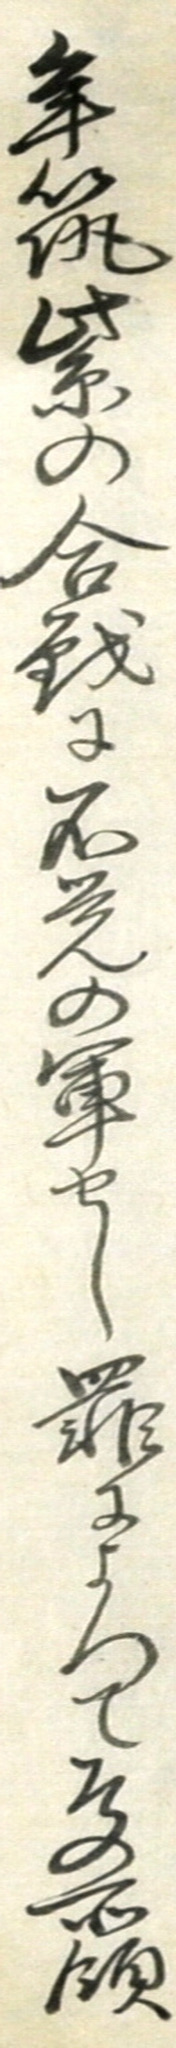年筑紫の合戦に不覚の軍せし罪によつてその所領
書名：藩翰譜（六）
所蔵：伊那市立高遠町図書館・合同会社AMANE
